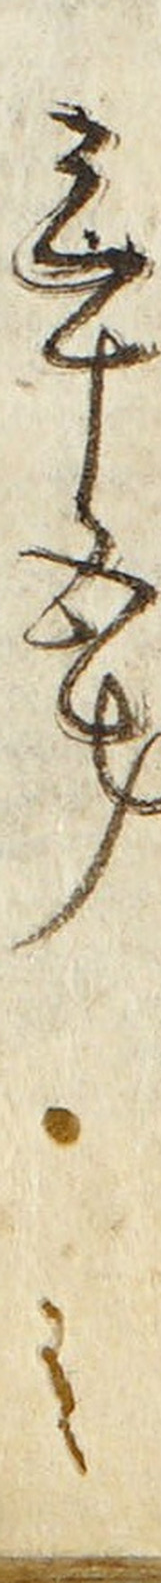三十五才
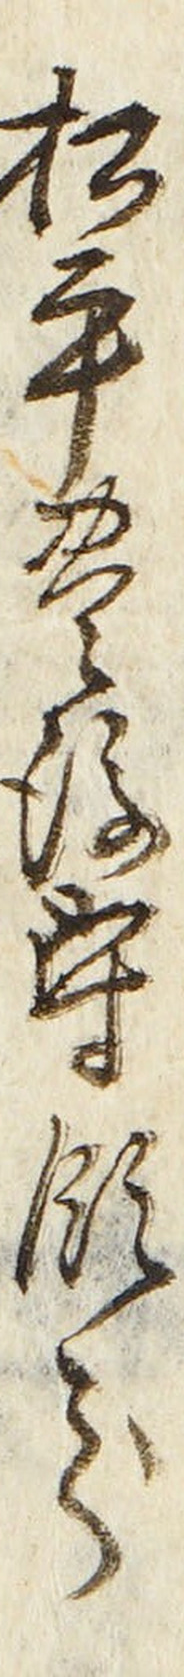松平豊後守領分
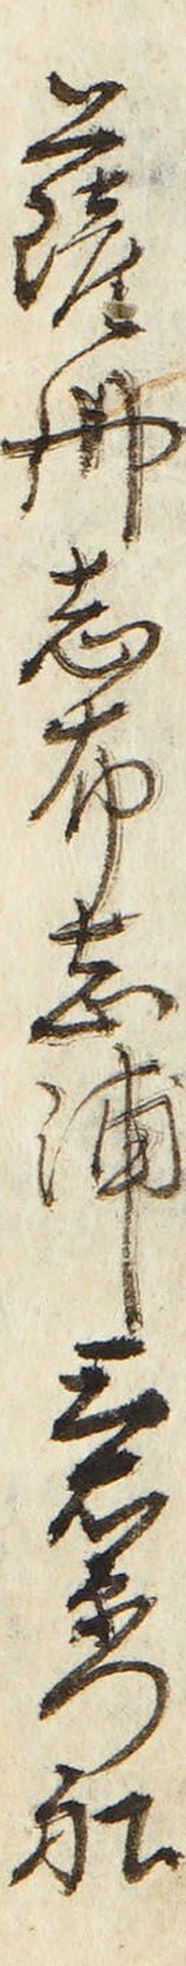薩州志布志浦三右衛門船
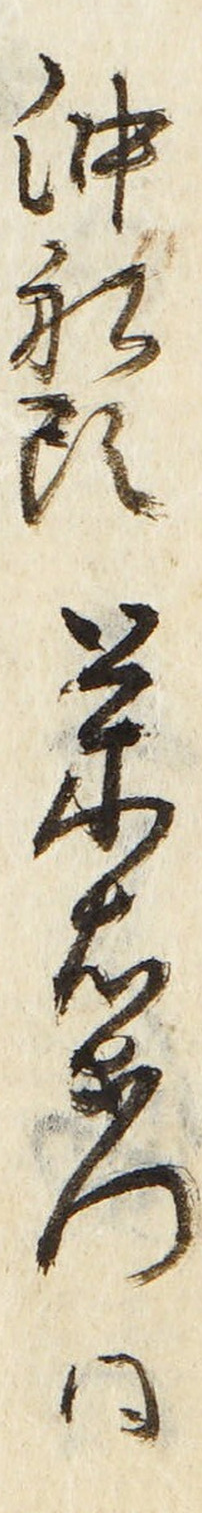沖船頭栄右衛門同
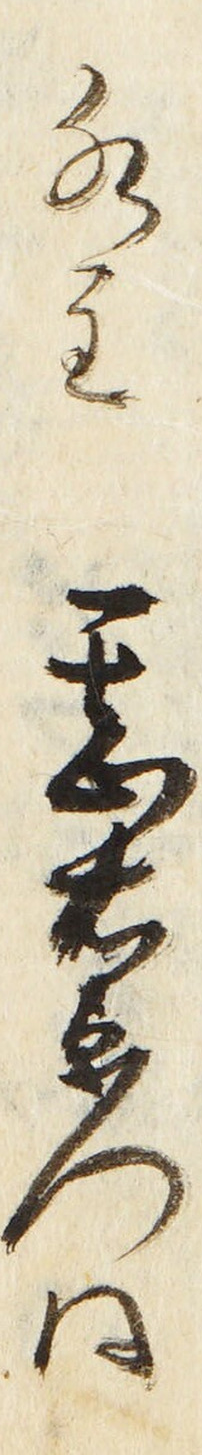水主甚右衛門同
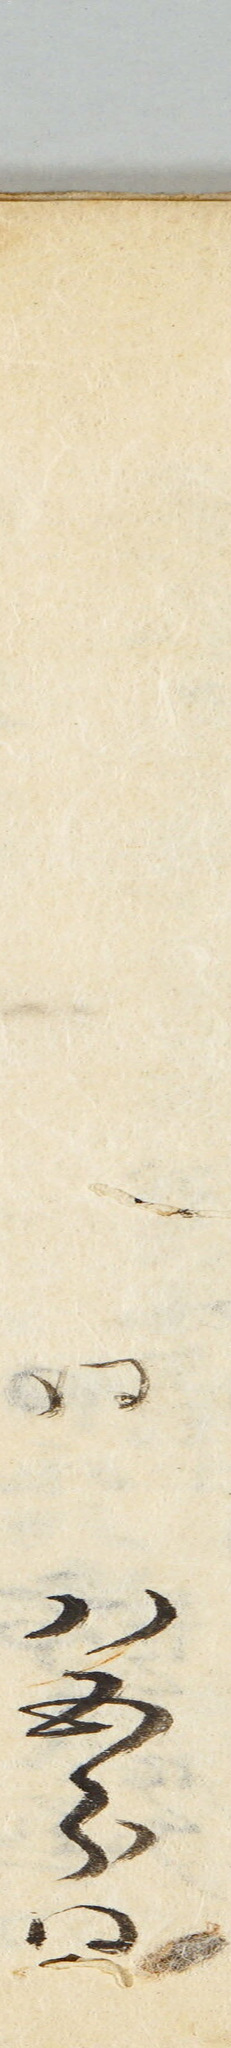同八五郎同
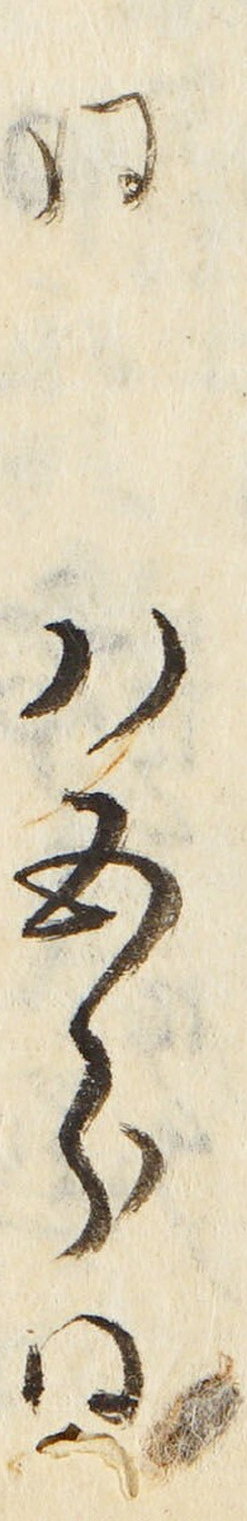同八五郎同
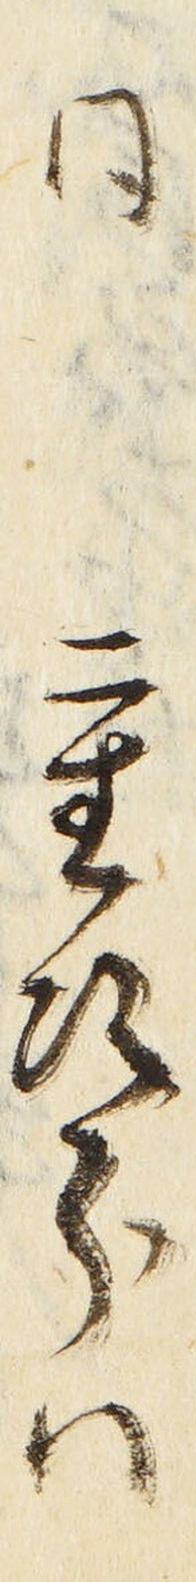同重次郎同
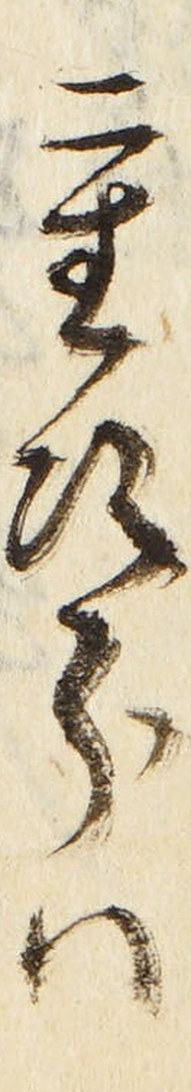同重次郎同
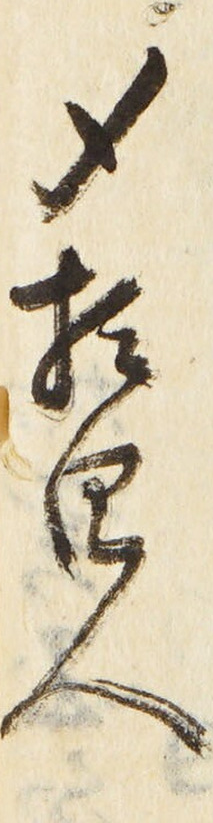〆拾四人
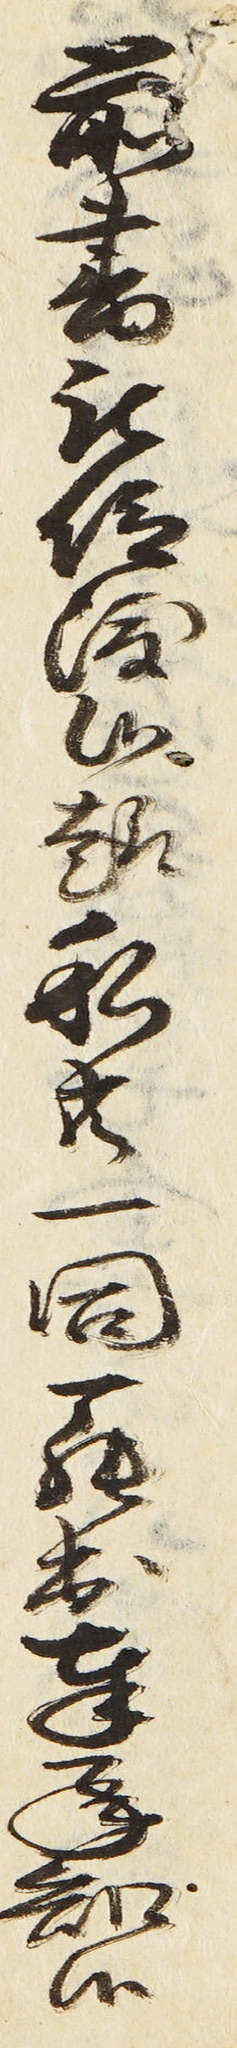前書被仰渡候趣私共一同罷出奉承知候
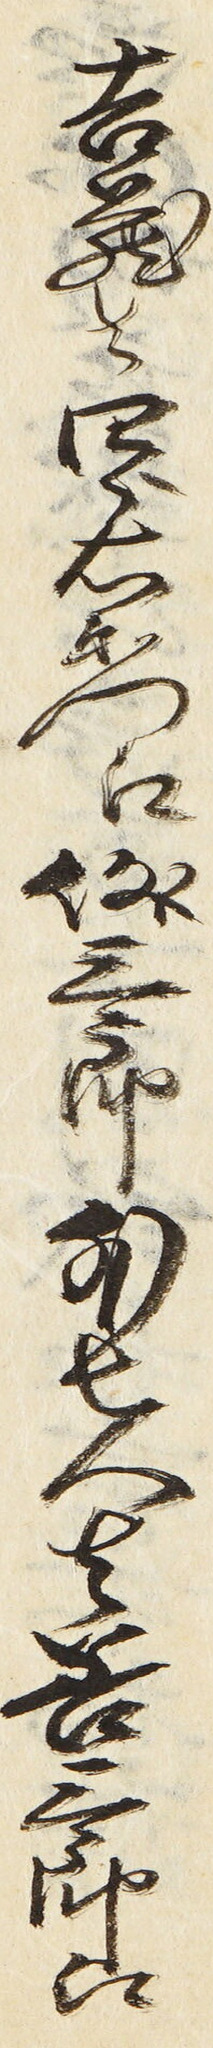吉蔵者四郎右衛門江儀三郎外七人者善三郎江
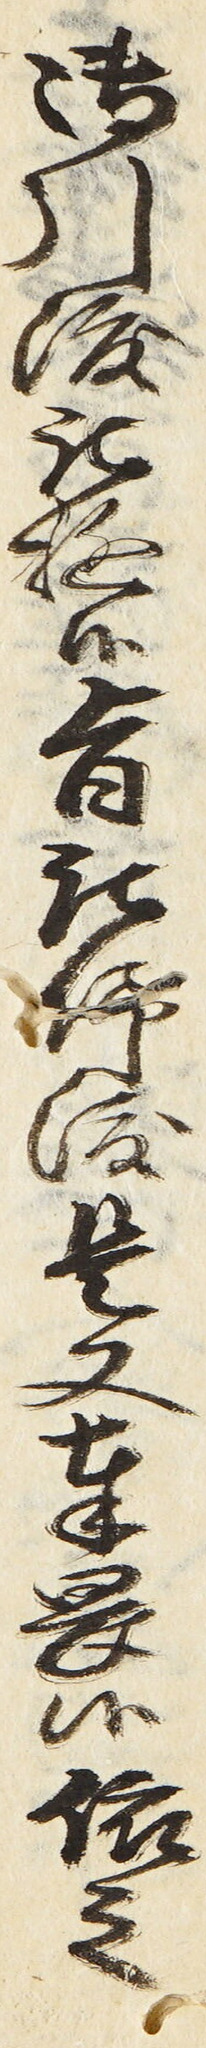御引渡被遊候旨被仰渡是又奉畏候依之
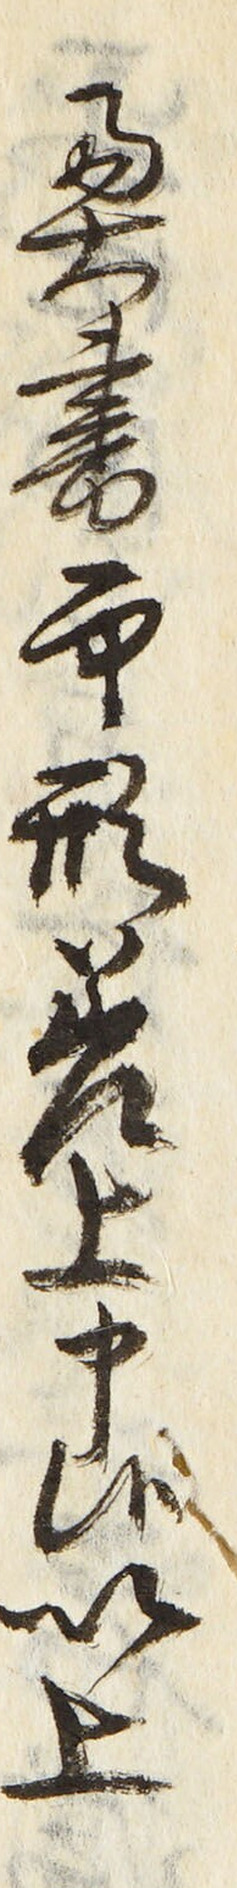奥書印形差上申候以上

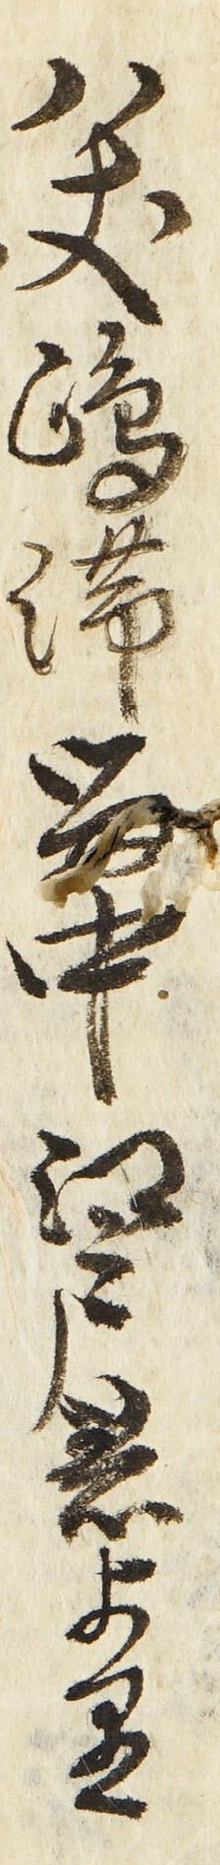八丈嶋滞留中江戸着より
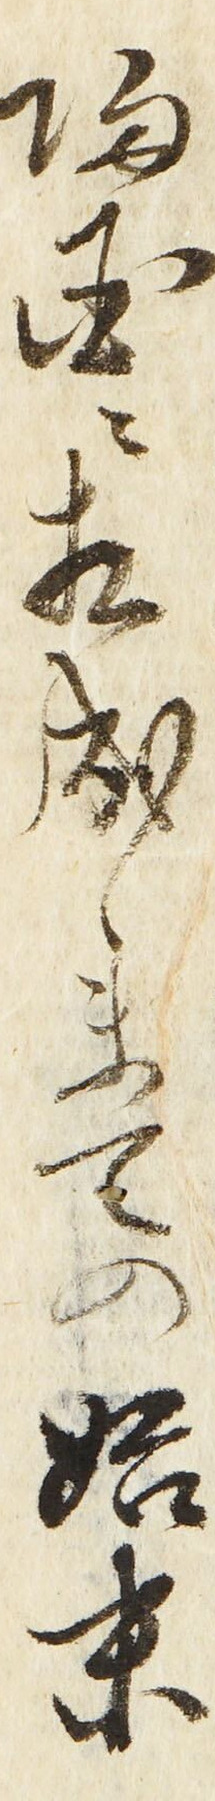帰国ニ相成候まての始末
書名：漂流一件上書
